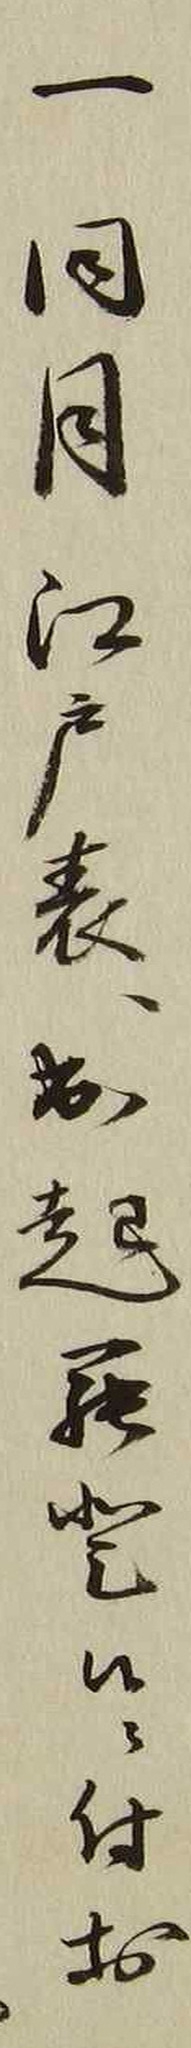一同月江戸表へ出起罷登候に付於
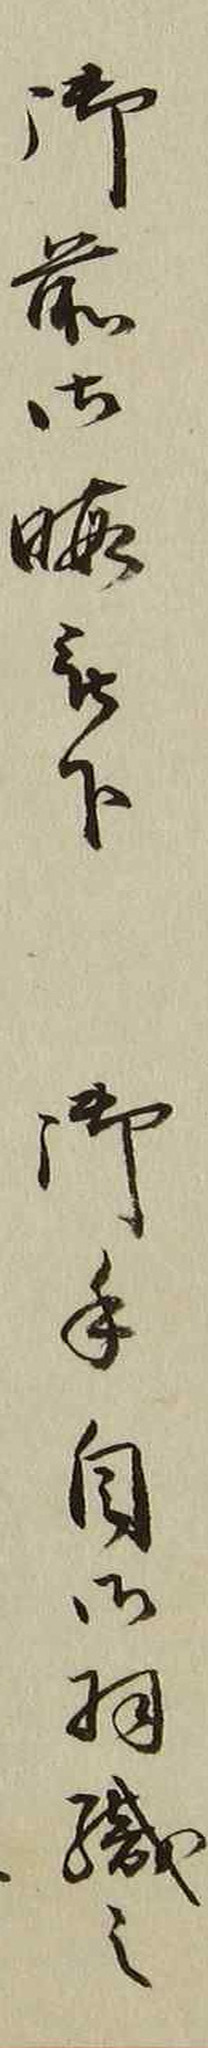御前御暇被下御手自御羽織之
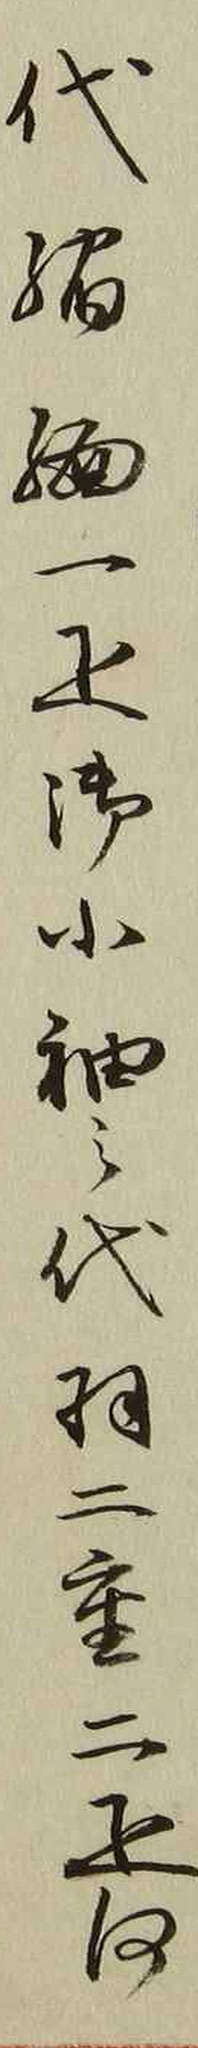代縮緬一疋御小袖之代羽二重二疋何
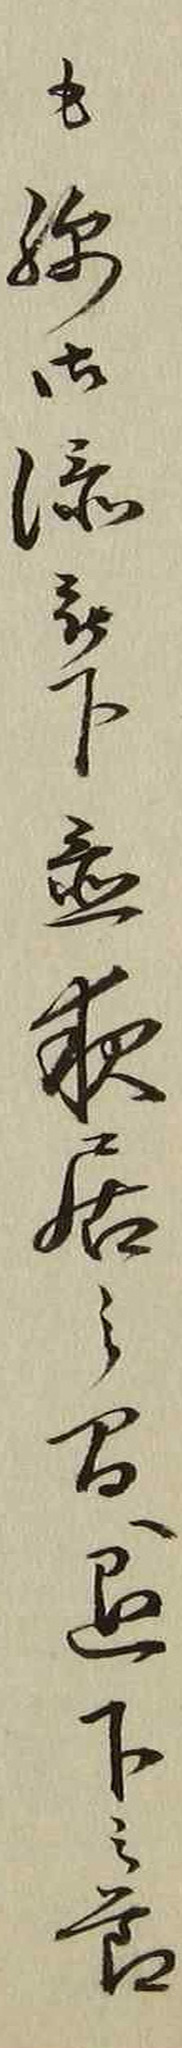も綿御添被下置夜居之間へ退下之節
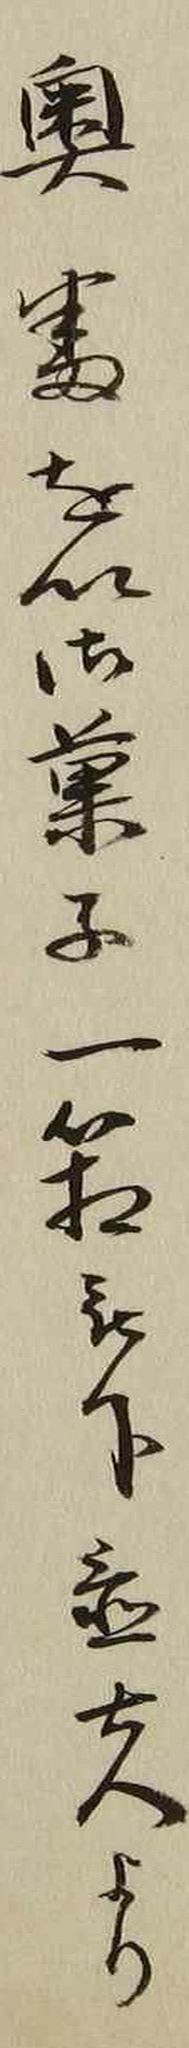奥番を以御菓子一箱被下置夫より
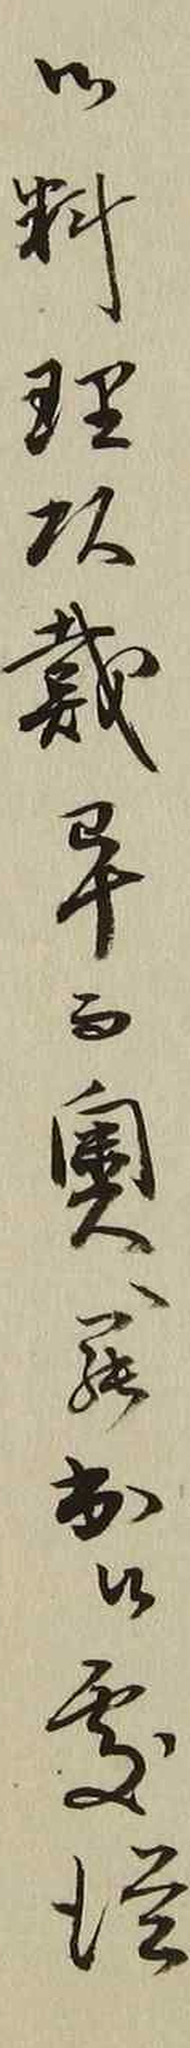御料理頂戴畢而奥へ罷出候処従
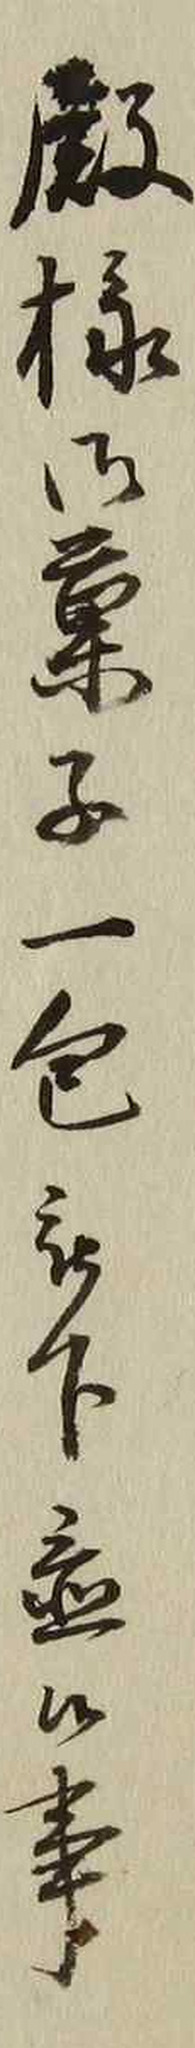殿様御菓子一包被下置候事
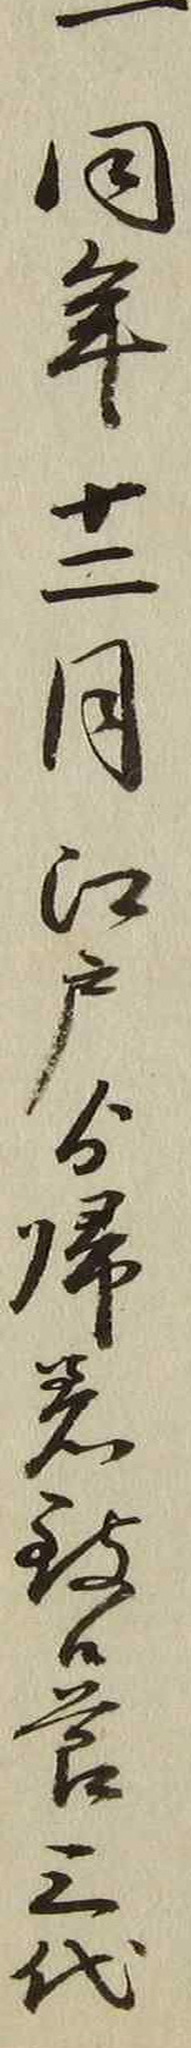一同年十二月江戸ゟ帰着致候節三代
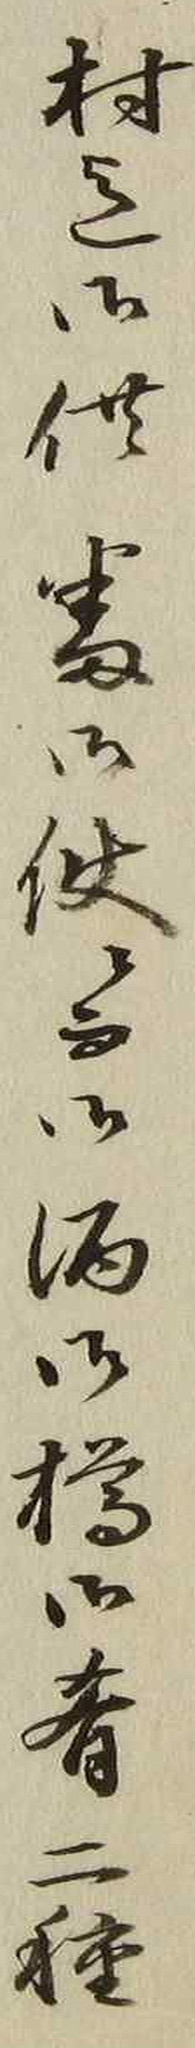村迄御供番御使に而御酒御樽御肴二種
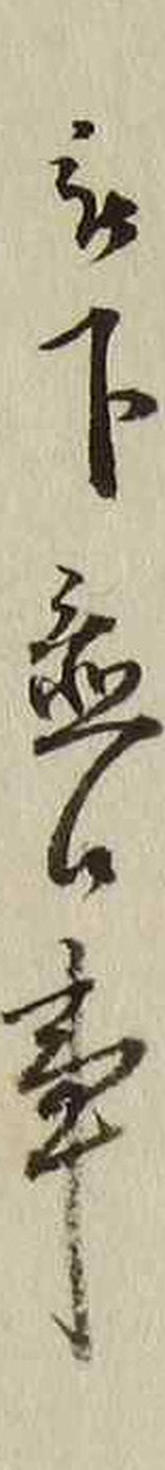被下置候事
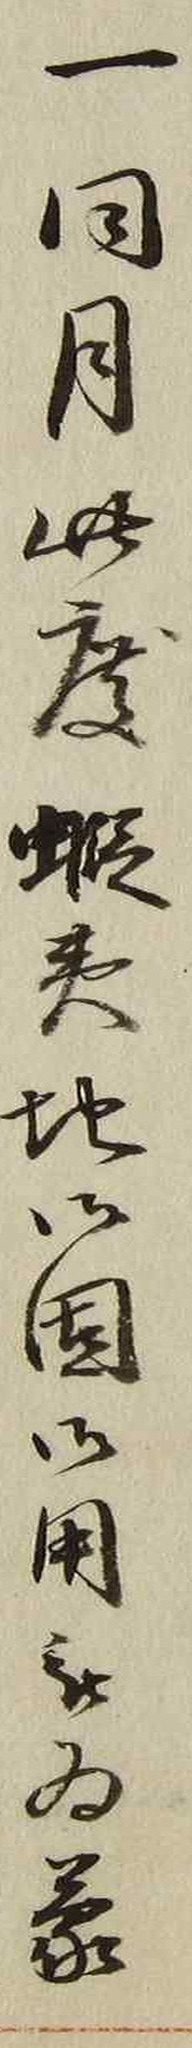一同月此度蝦夷地御固御用被為蒙
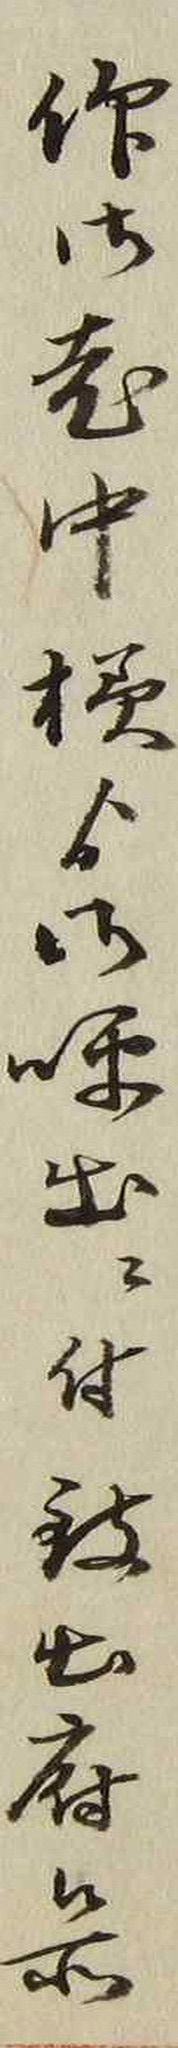仰御老中様ゟ御呼出に付致出府候所
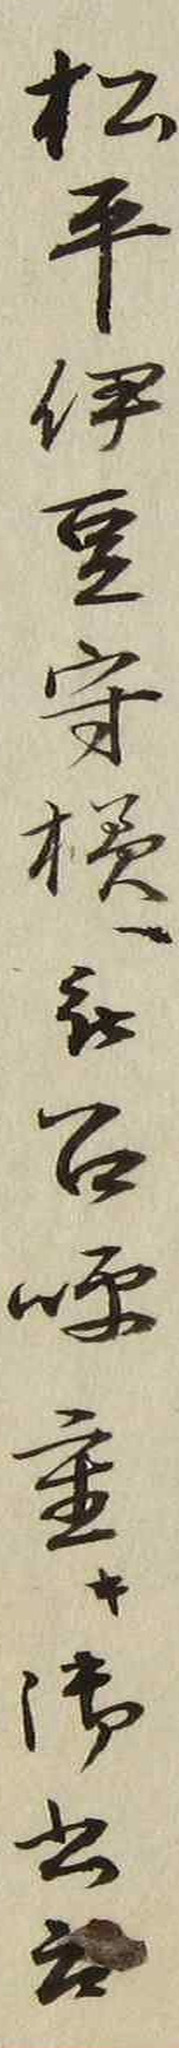松平伊豆守様へ被召呼重き御書
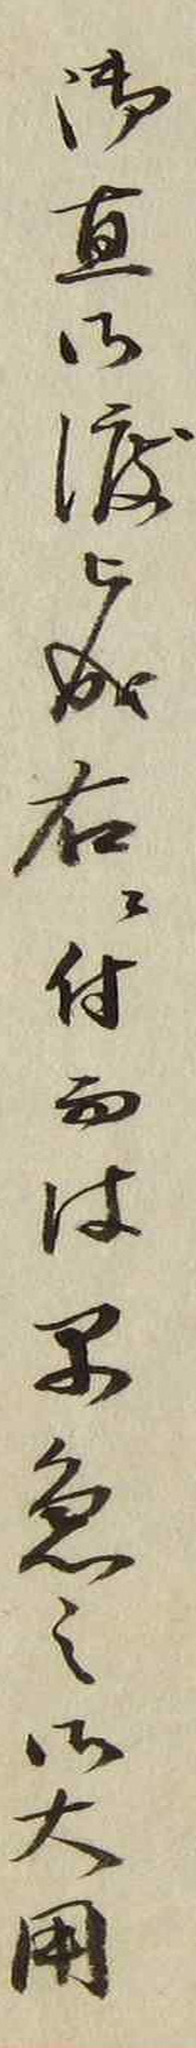御直御渡被成右に付而は早急之御大用
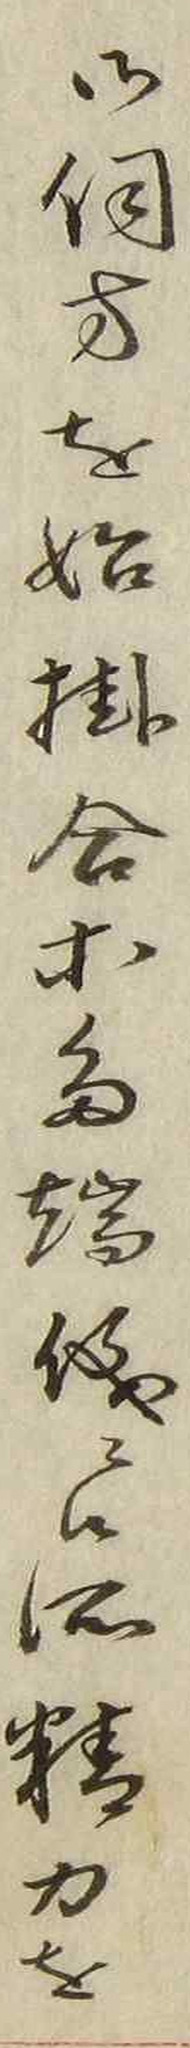御伺方を始掛合等多端儀に候所精力を
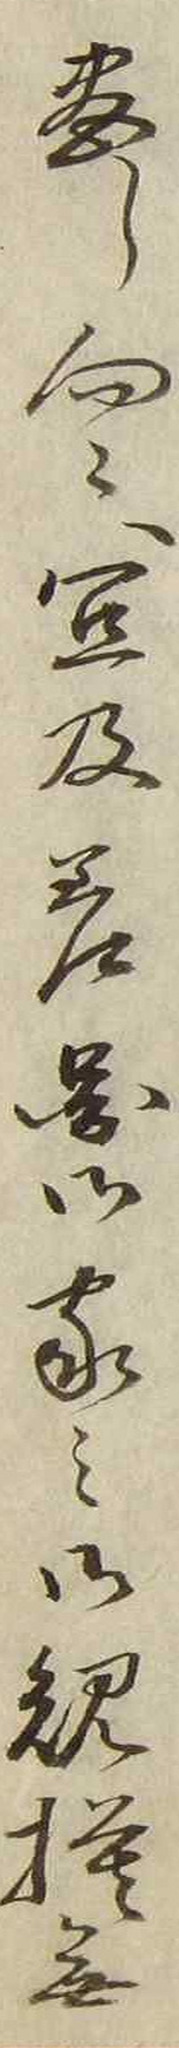尽し向々へ宜及差図御家之規模無
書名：諸士系譜　巻之125　た之部1
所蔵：会津若松市立会津図書館
